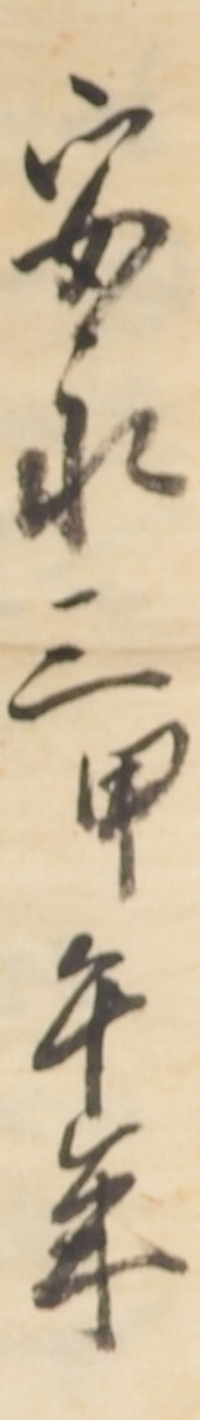安永三甲午年
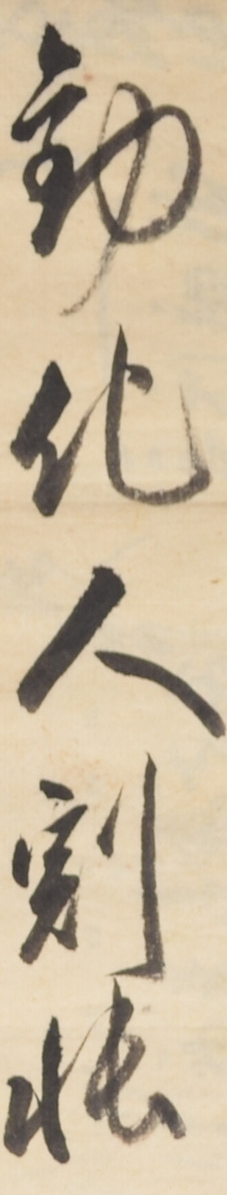勧化人割帳
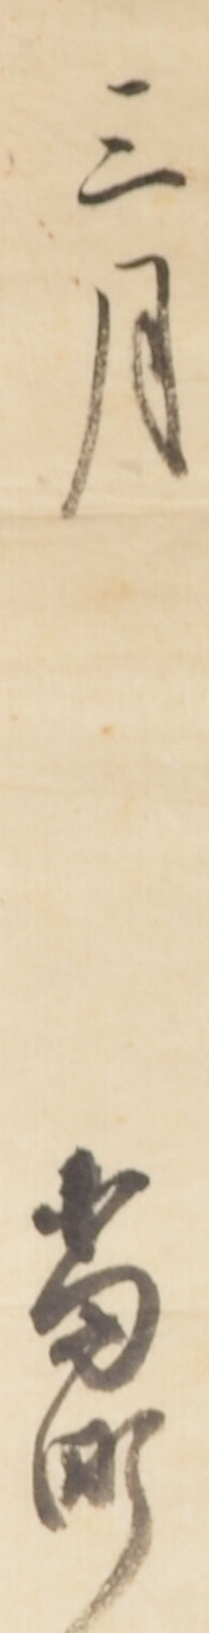三月当町

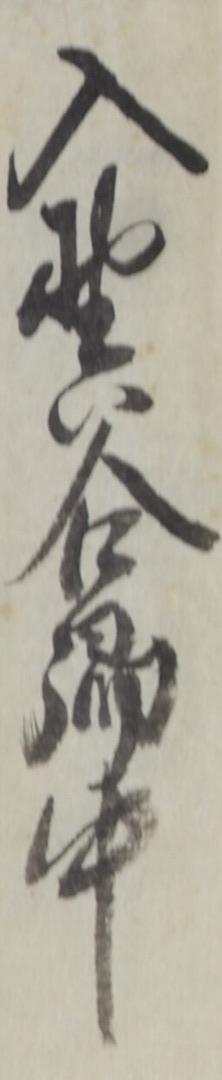入野谷郷中

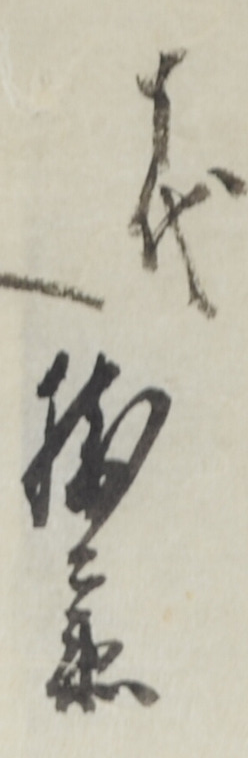勝兵衛
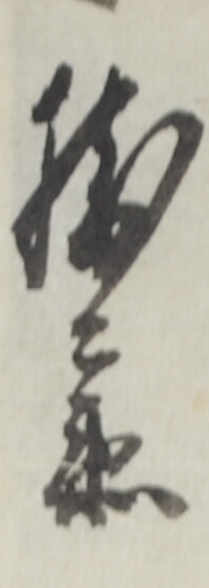勝兵衛
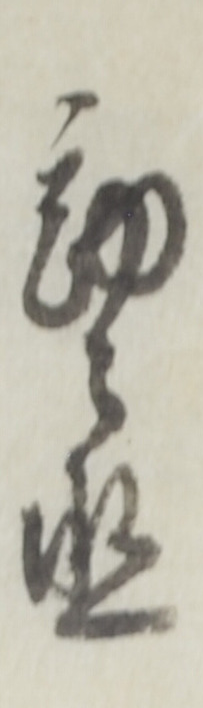勘之丞
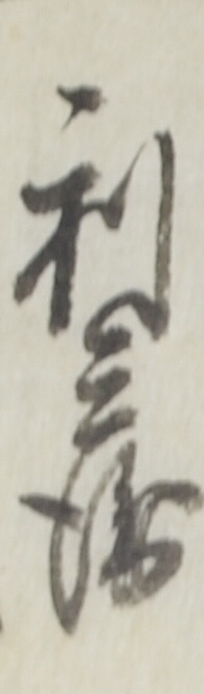利兵衛

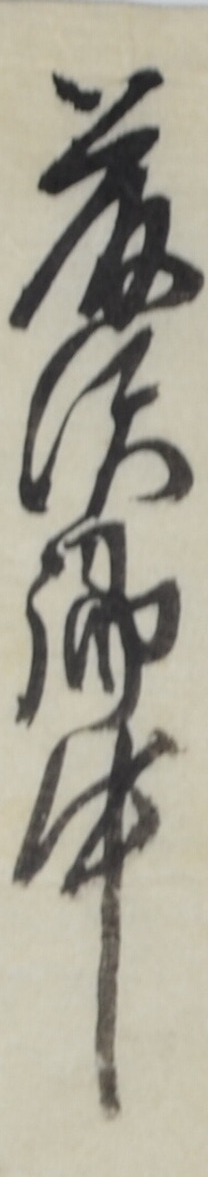藤沢郷中
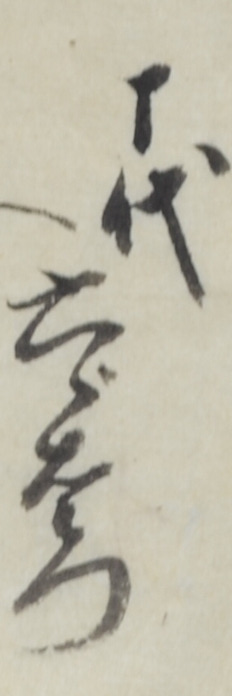六郎右衛門
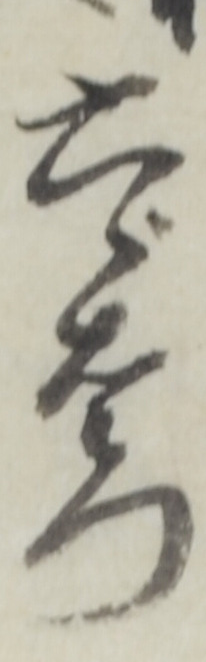六郎右衛門
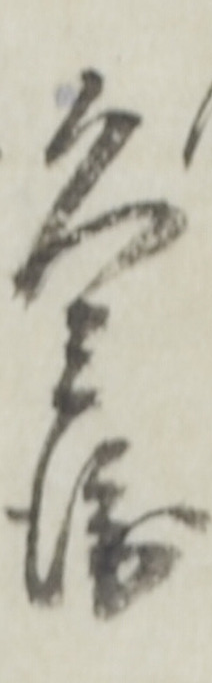久兵衛
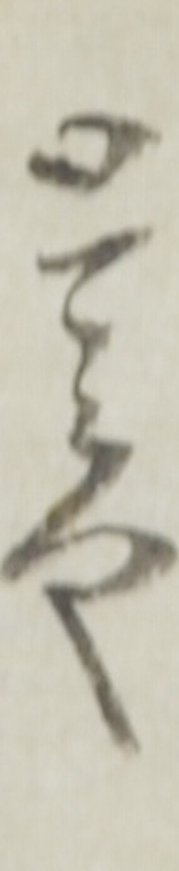とミや
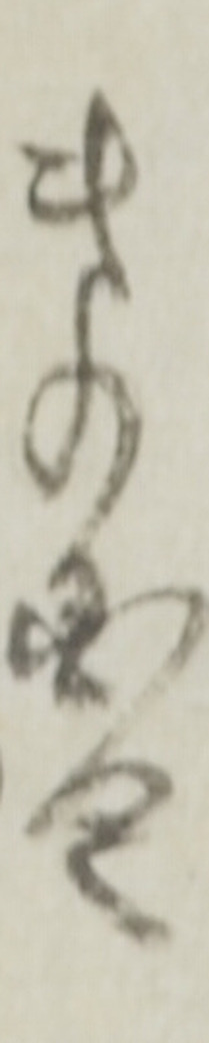きの国や
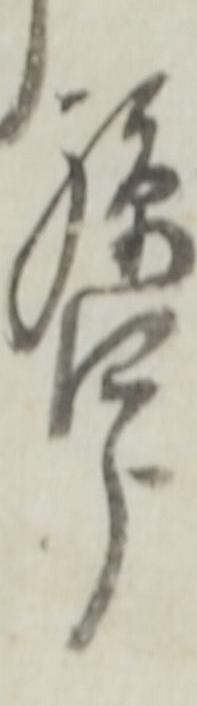孫四郎
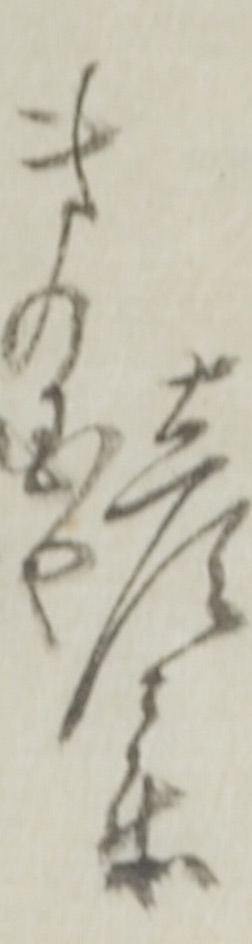きの国や
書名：勧化人割帳
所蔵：伊那市立高遠町図書館・合同会社AMANE
